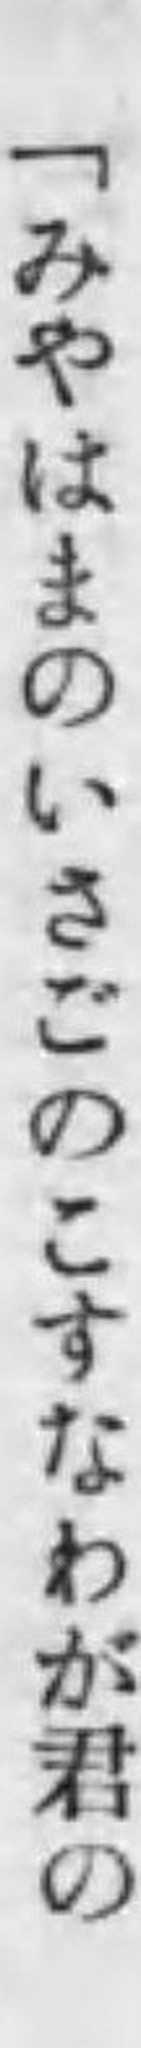「みやはまのいさごのこすなわが君の
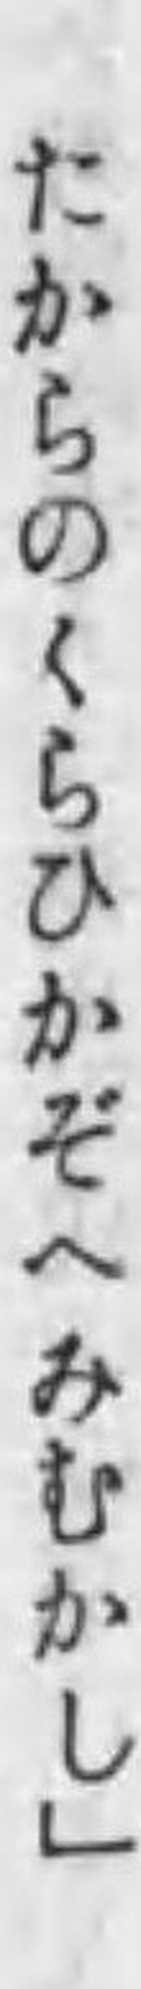たからのくらひかぞへみむかし」
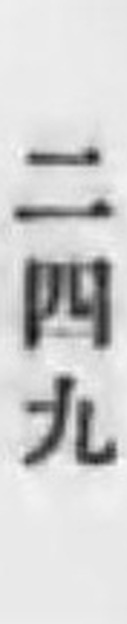二四九

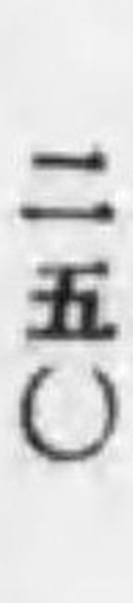二五〇
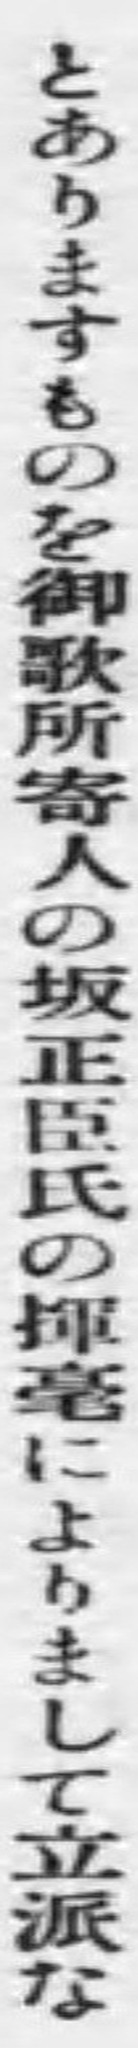とありますものを御歌所寄人の坂正臣氏の揮毫によりまして立派な
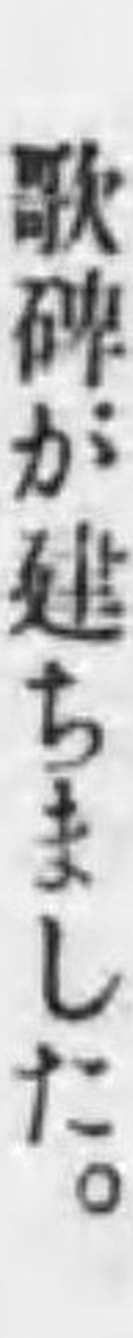歌碑が建ちました。
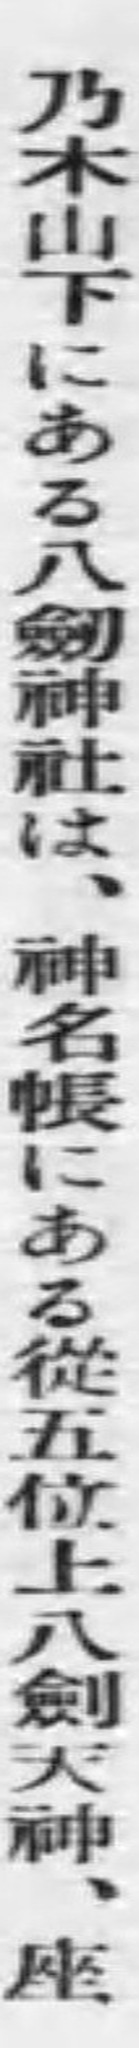乃木山下にある八剣神社は、神名帳にある従五位上八剣天神、座
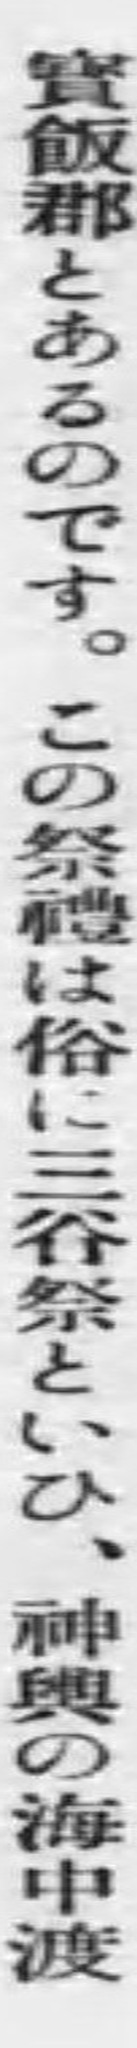宝飯郡とあるのです。この祭礼は俗に三谷祭といひ、神輿の海中渡
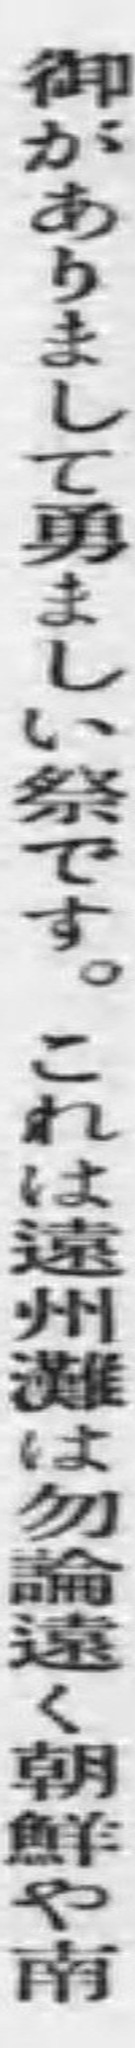御がありまして勇ましい祭です。これは遠州灘は勿論遠く朝鮮や南
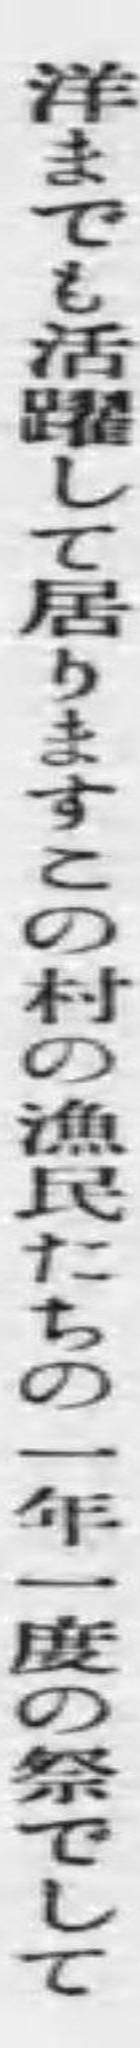洋までも活躍して居りますこの村の漁民たちの一年一度の祭でして
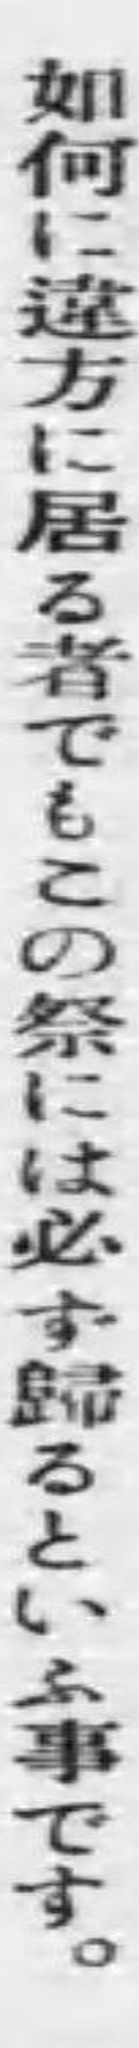如何に違方に居る者でもこの祭には必ず帰るといふ事です。
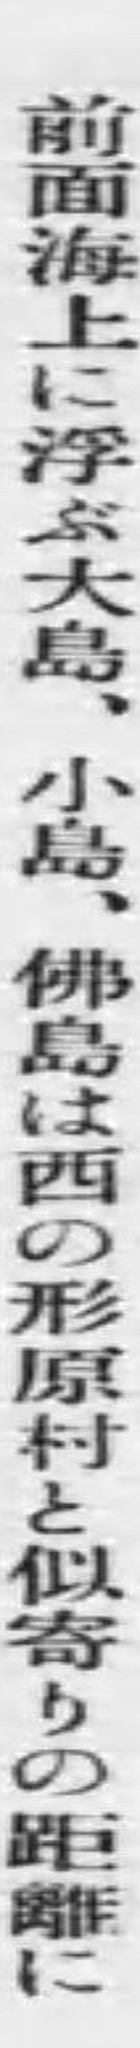前面海上に浮ぶ大島、小島、仏島は西の形原村と似寄りの距離に
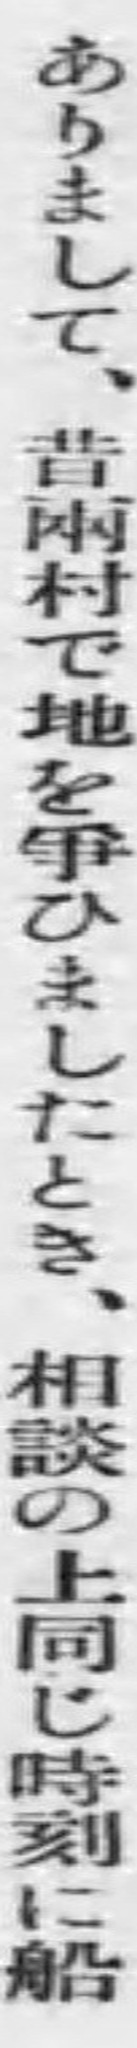ありまして、昔両村で地を争ひましたとき、相談の上同じ時刻に船
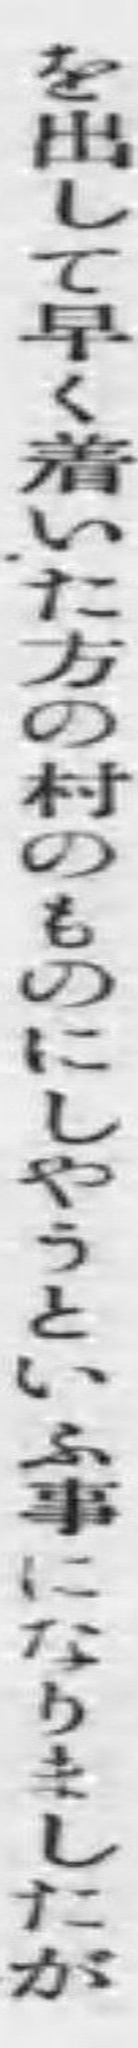を出して早く着いた方の村のものにしやうといふ事になりましたが
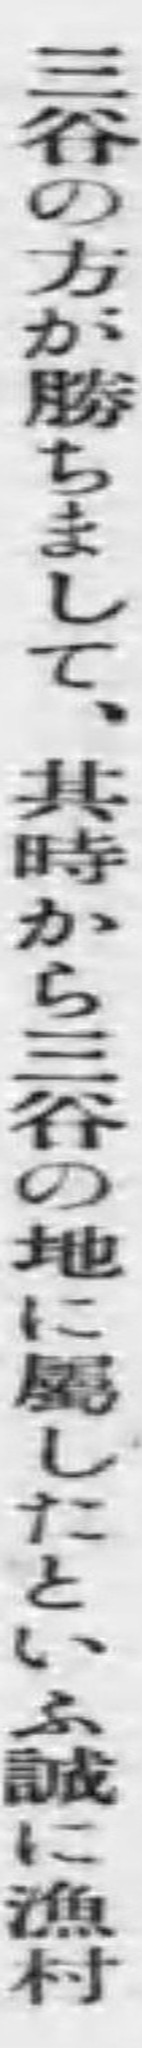三谷の方が勝ちまして、其時から三谷の地に属したといふ誠に漁村
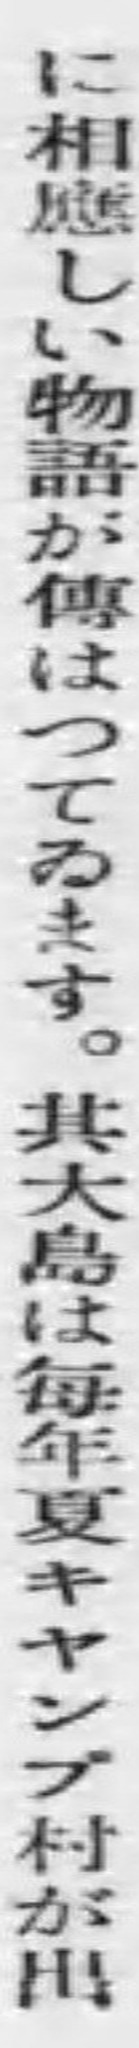に相応しい物語が伝はつてゐます。其大島は毎年夏キヤンプ村が出
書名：東三河道中記 : 豊橋市及其附近案内
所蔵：国立国会図書館 National Diet Library, JAPAN
